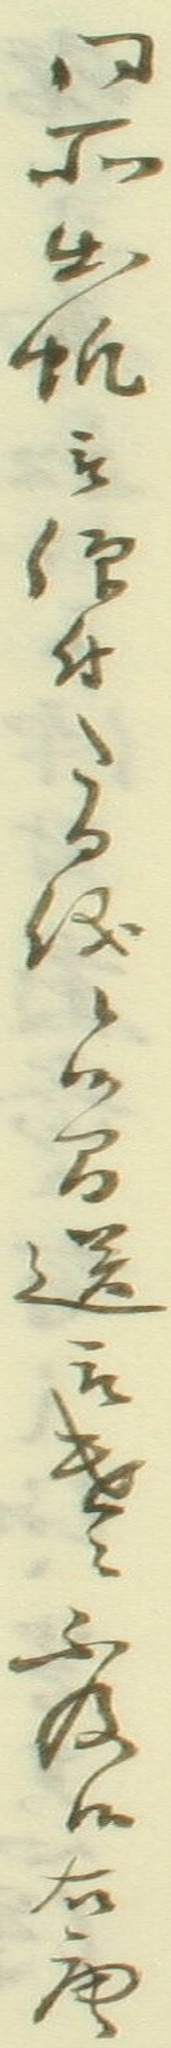同所出帆被仰付たる儀に候間送被遣に不及候右唐
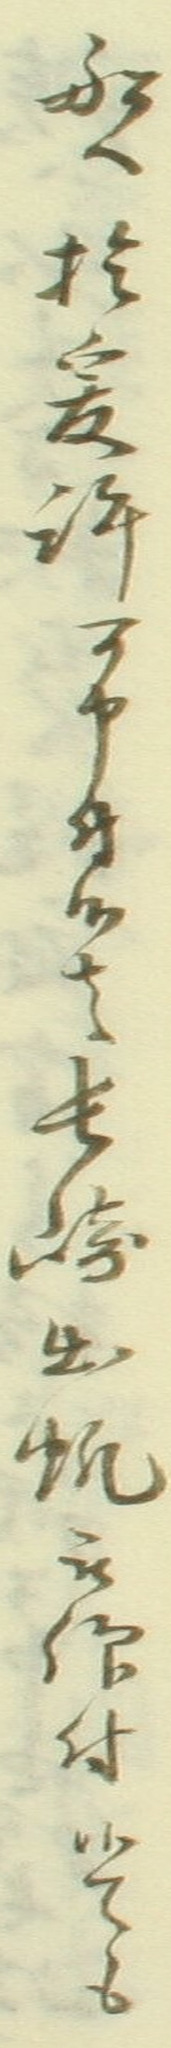船へ於爰許可申付候は長崎出帆被仰付候ても
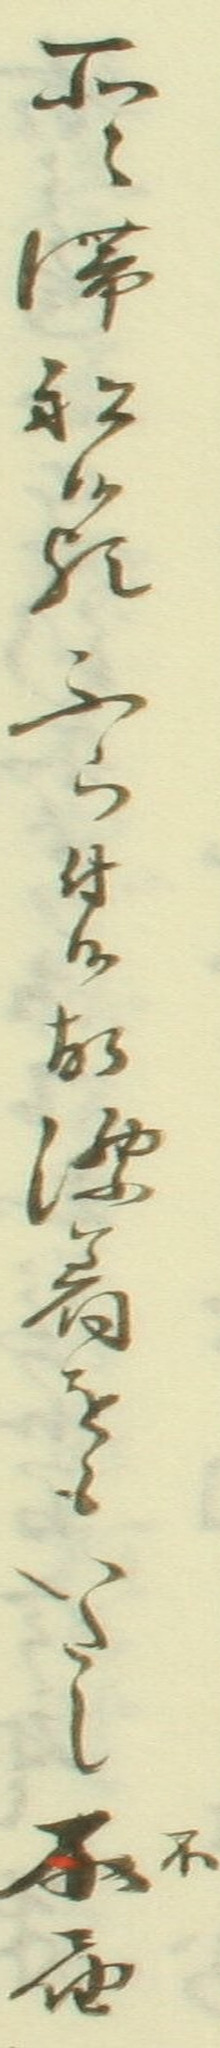所々滞船候歟不被付候故漂着をもいたし不届
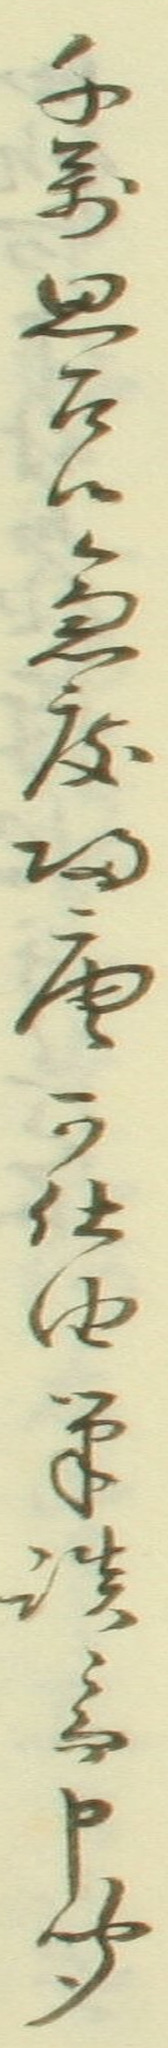千万思召候急度帰唐可仕由筆談に而申聞

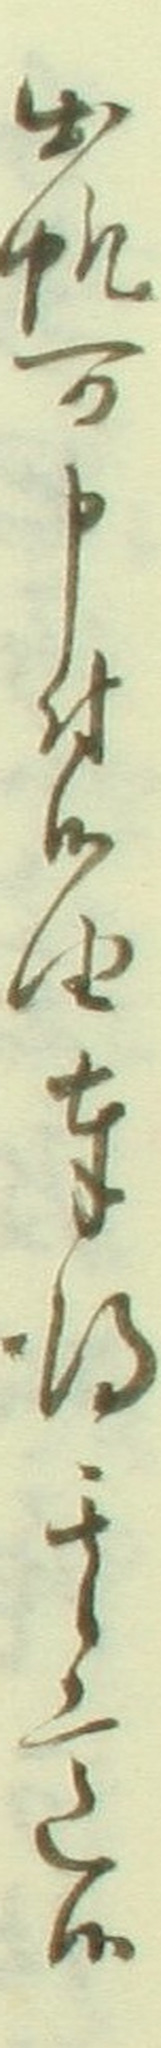出帆可申付候由奉得其意候
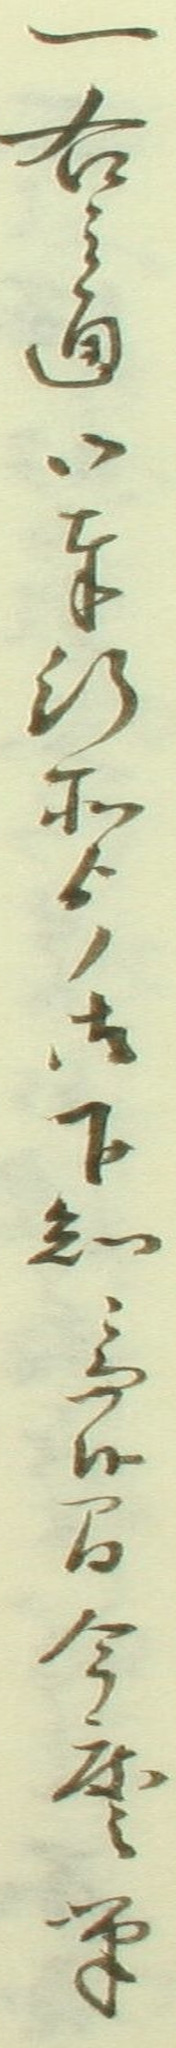一右之通御奉行所ゟノ御下知に而候間今度之筆
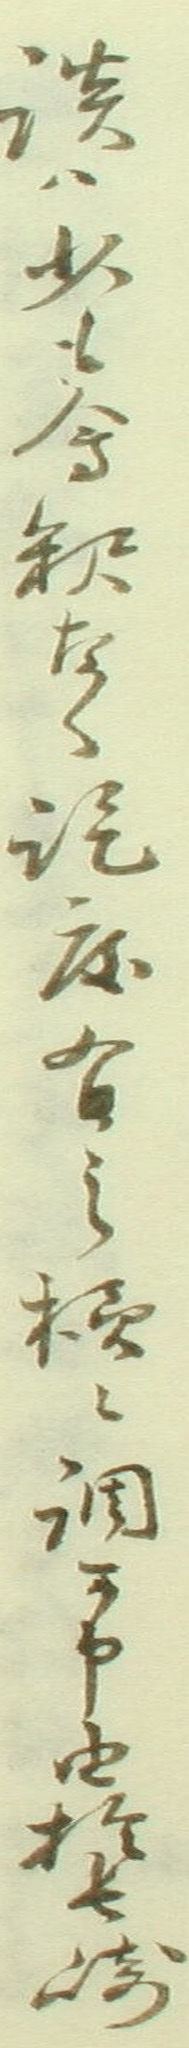談は少も会釈なく屹度有之様に調可申由於長崎
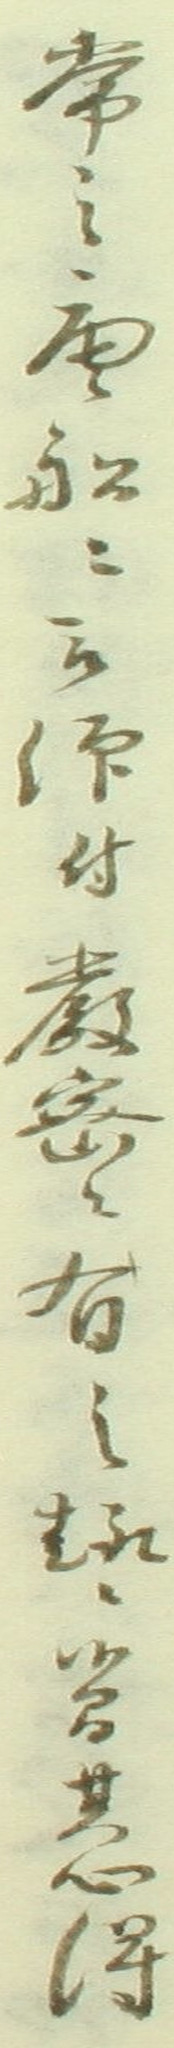常之唐船に被仰付厳密に有之趣に候間其心得
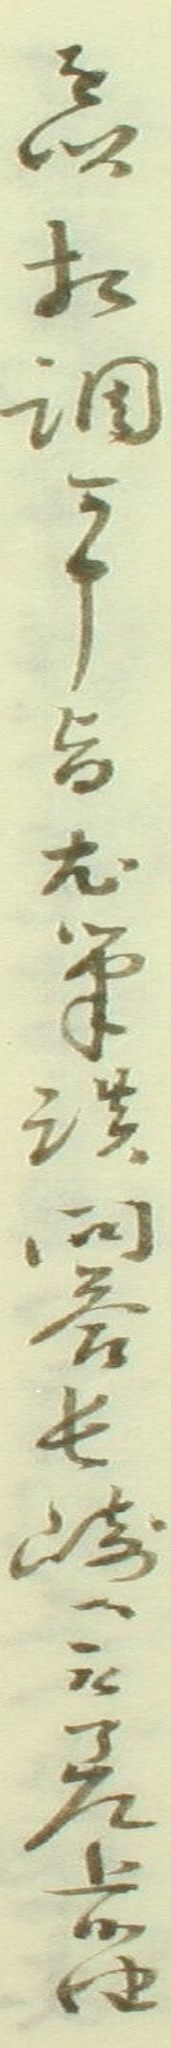を以相調可申旨尤筆談問答長崎へ被差上候由
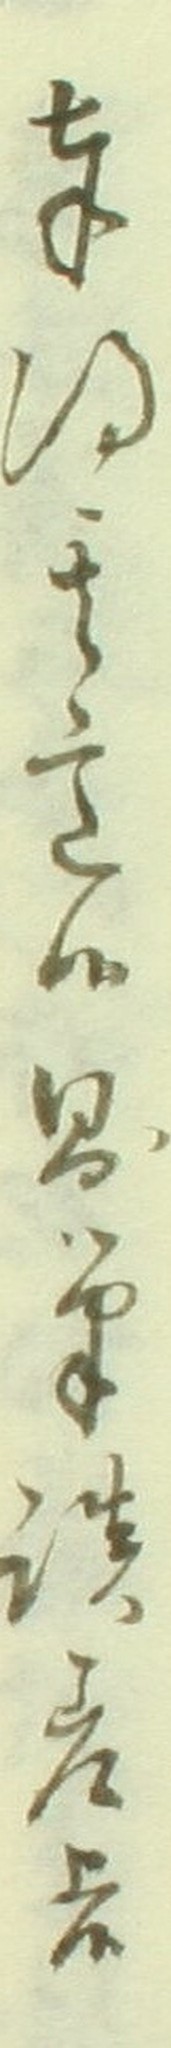奉得其意候則筆談差上げ候
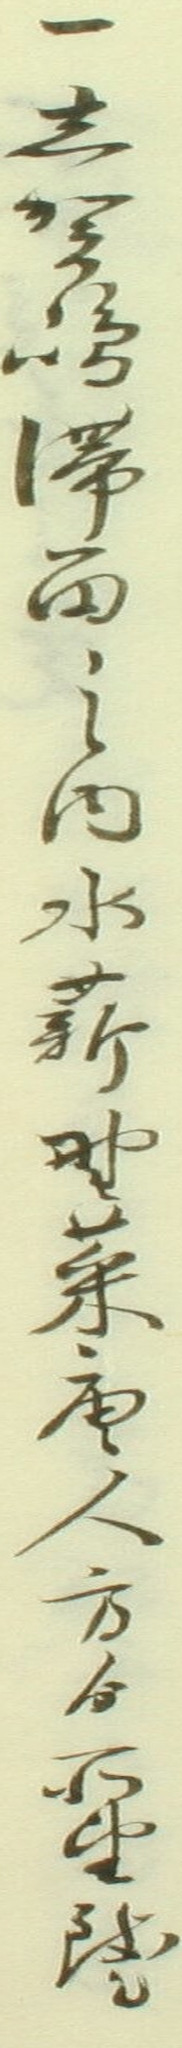一志賀島滞留之内水薪野菜唐人方ゟ所望致し
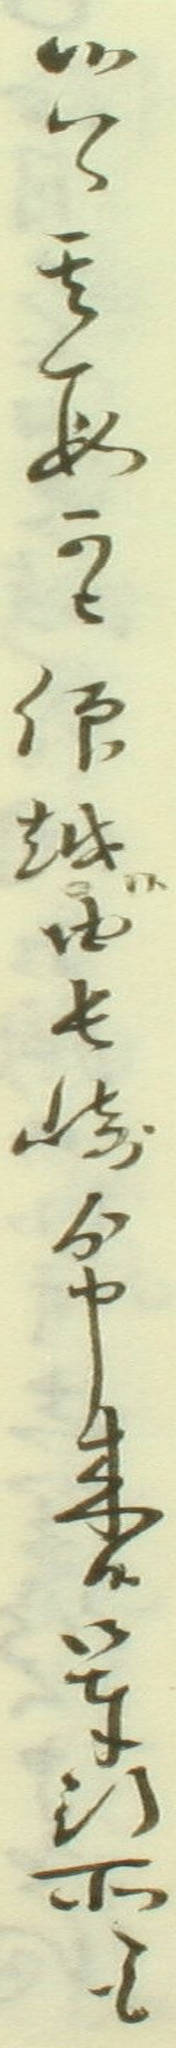候はゝ其段可被仰越◦由長崎ゟ申来候御奉行所へも
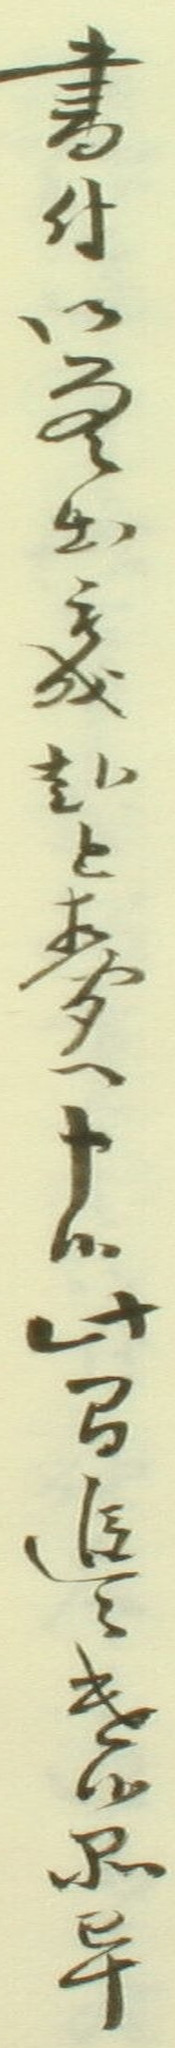書付御差出被成赴と相聞へ申候此間追々遣候品畢
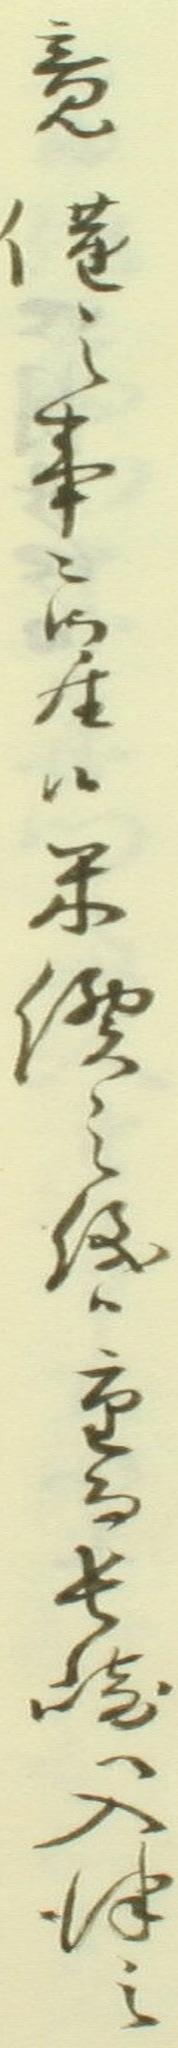竟僅之事に御座候米価之儀は重而長崎へ入津之
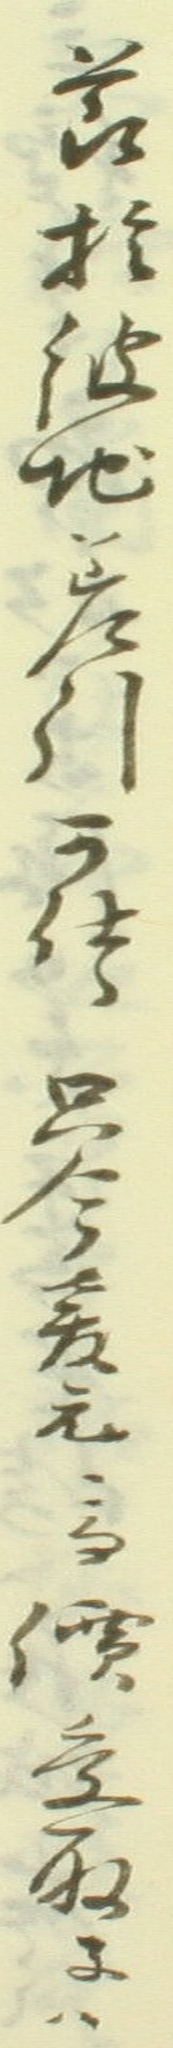節於彼地差引可仕候只今爰元に而価受取には
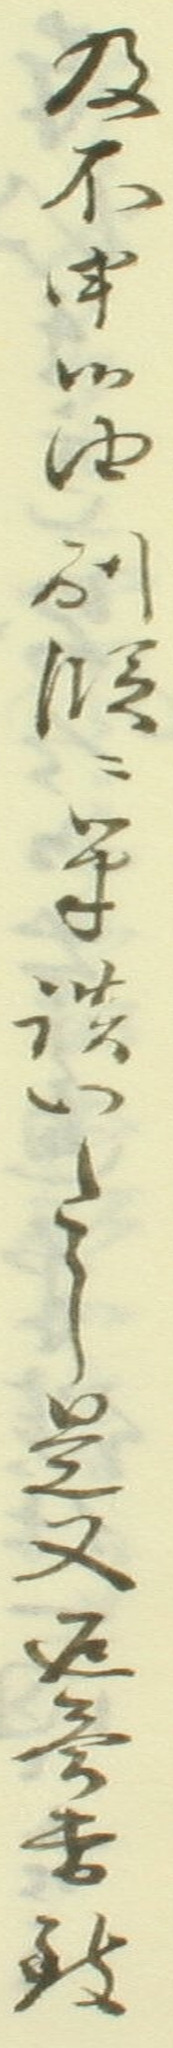及不申候由別段にひ筆談いたし是又返答書致
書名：異国船漂着記
